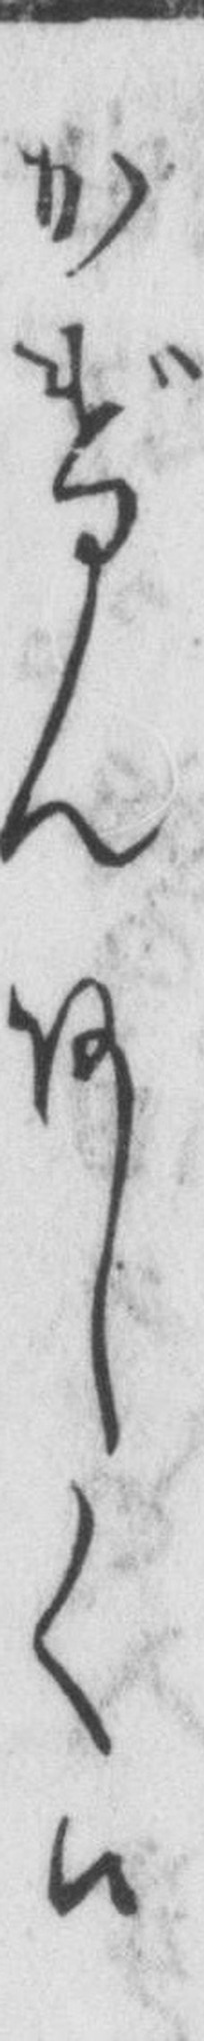かげんあしく候
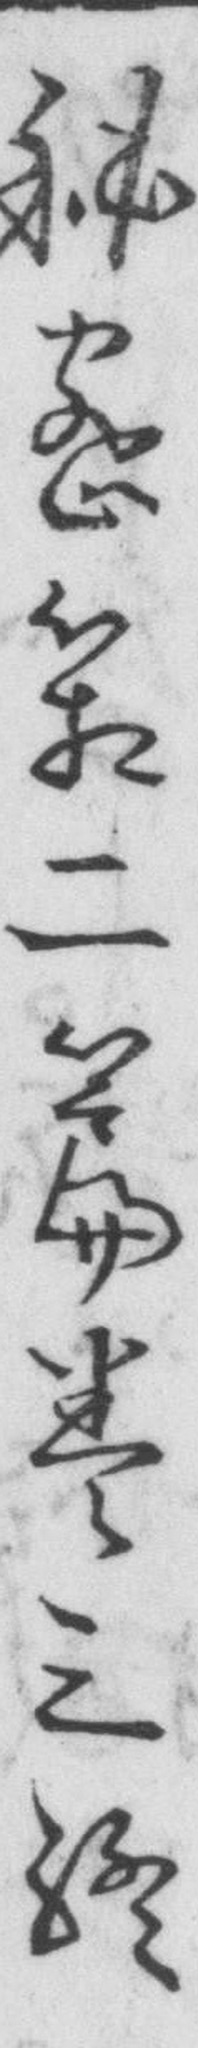秘密箱二篇巻三終
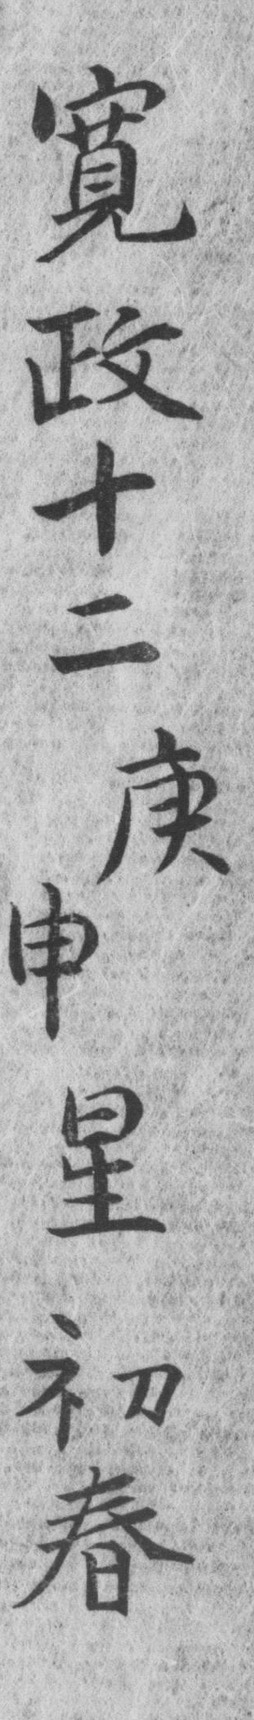寛政十二庚申星初春
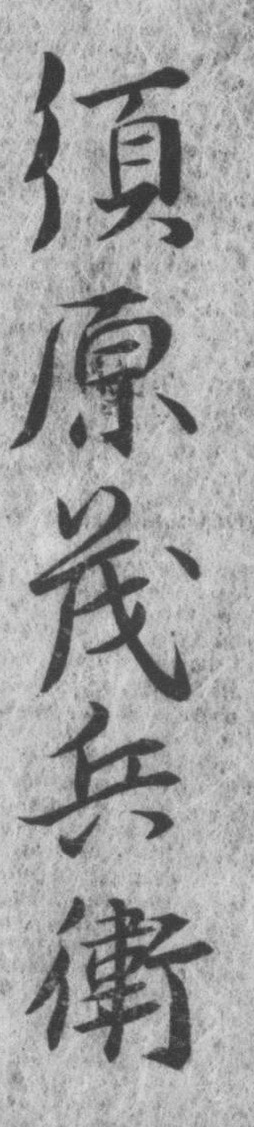須原茂兵衛
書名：萬寳料理秘密箱
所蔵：大阪府立大学学術情報センター 国文学研究資料館
